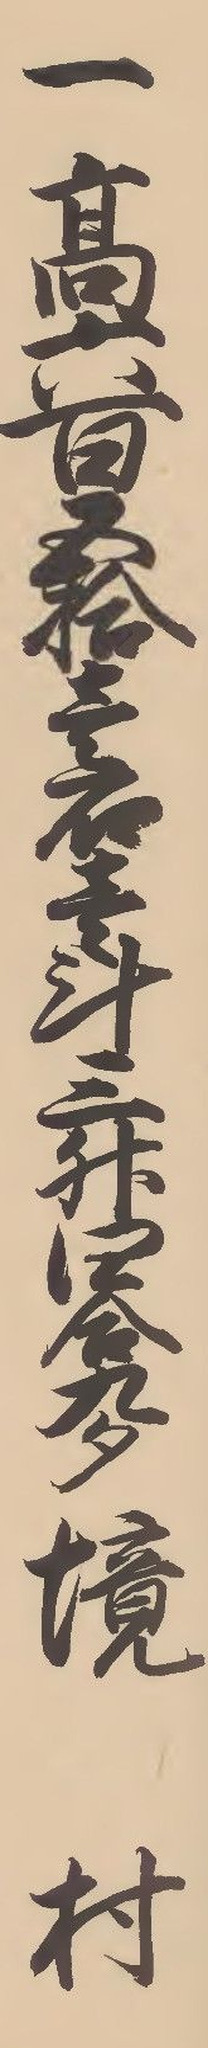一高六百五拾壱石壱斗三升四合九勺境村
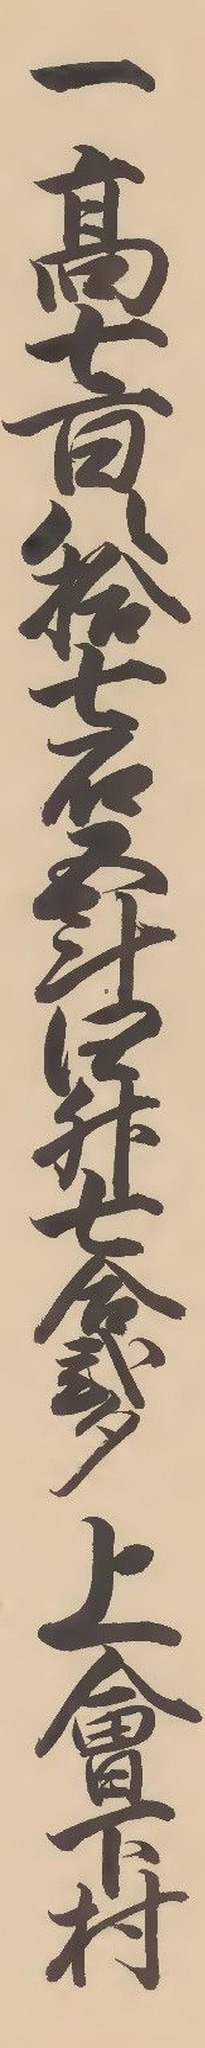一高七百八拾七石五斗四升七合弐勺上会下村
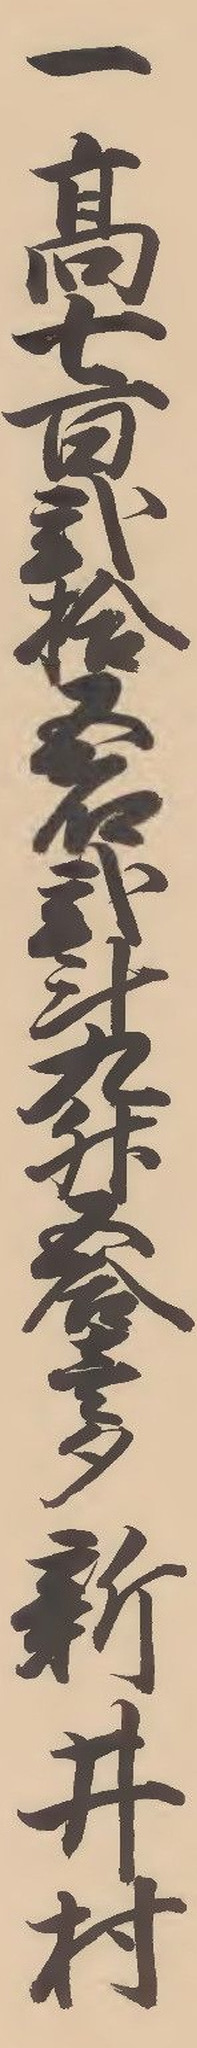一高七百弐拾五石弐斗九升五合壱勺新井村
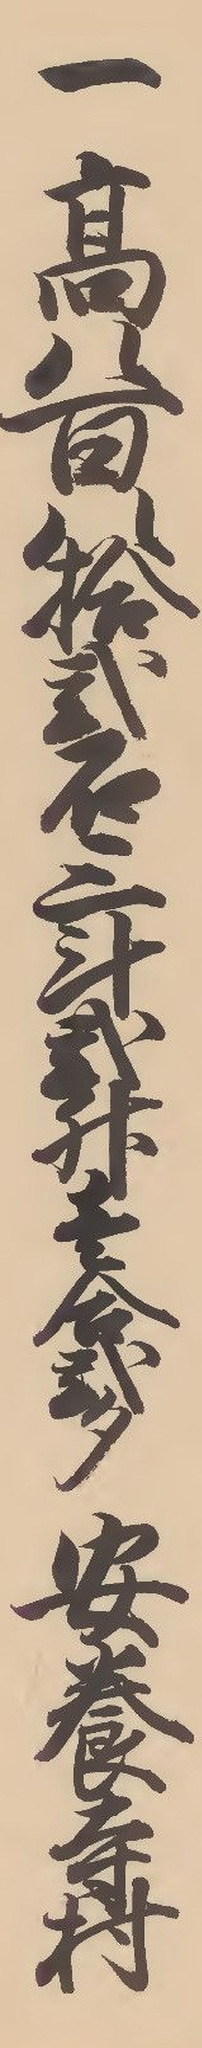一高八百八拾弐石三斗弐升壱合弐勺安養寺村

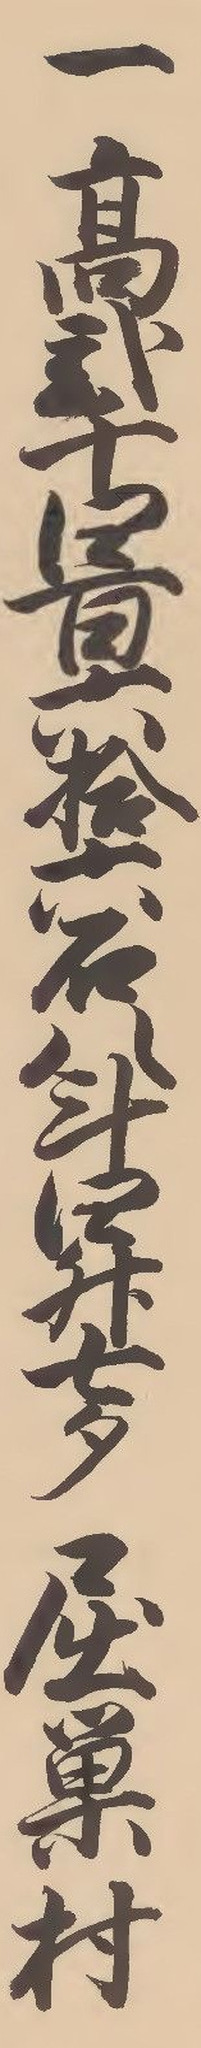一高弐千四百六拾六石八斗四升七勺屈巣村
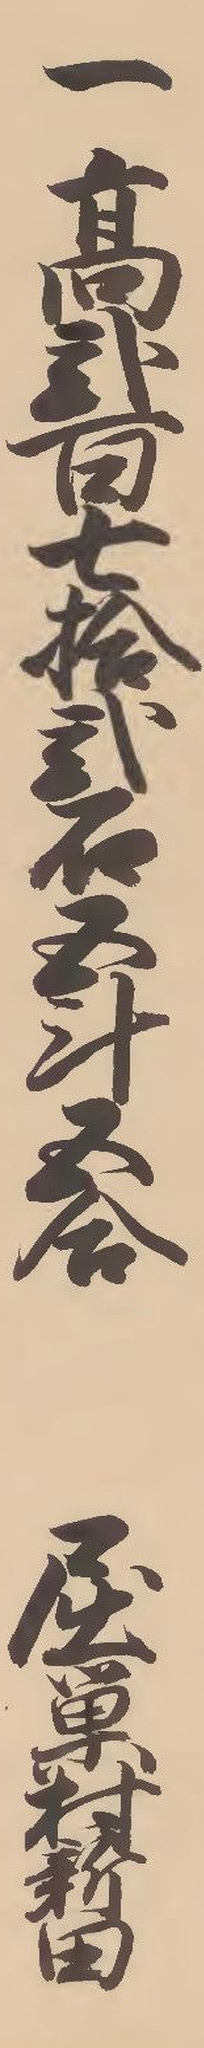一高弐百七拾弐石五斗五合屈巣村新田
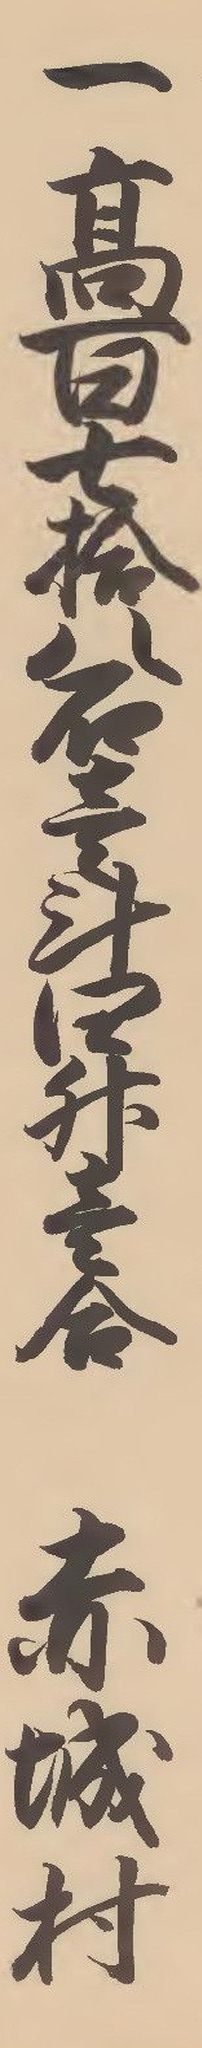一高百七拾八石壱斗四升壱合赤城村
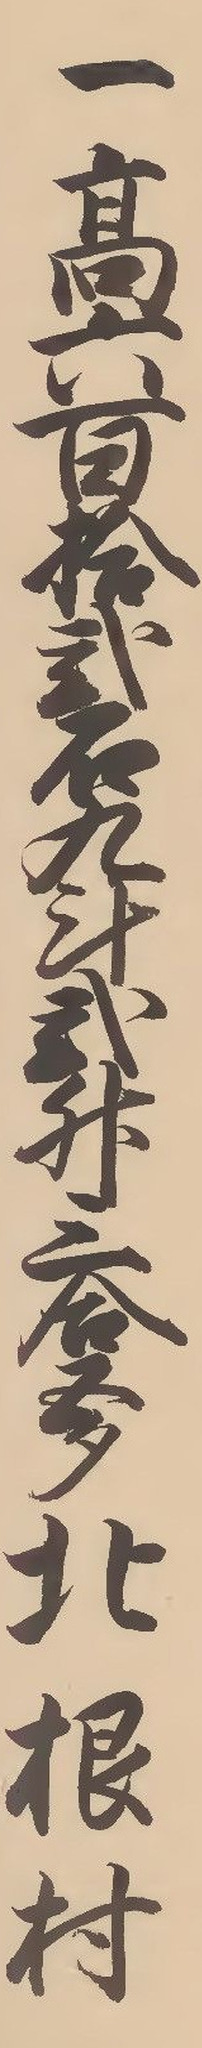一高六百拾弐石九斗弐升三合五勺北根村
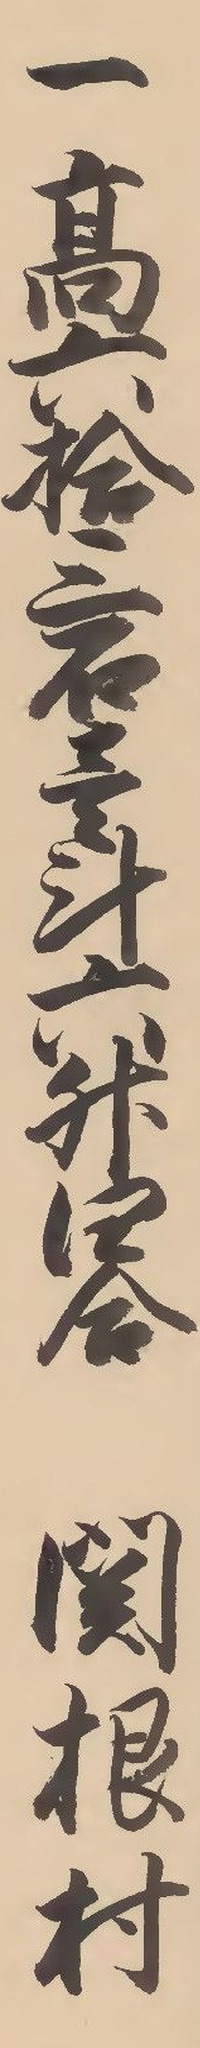一高六拾三石壱斗六升四合関根村
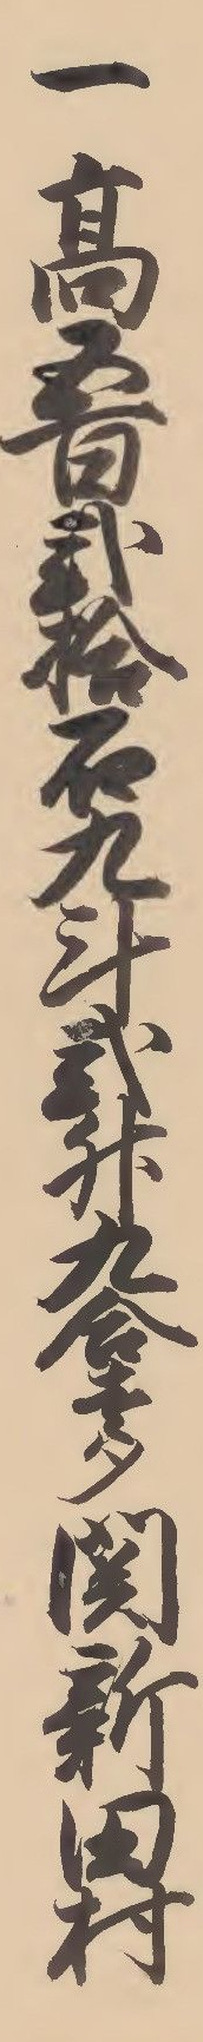一高五百弐拾石九斗弐升九合壱勺関新田村
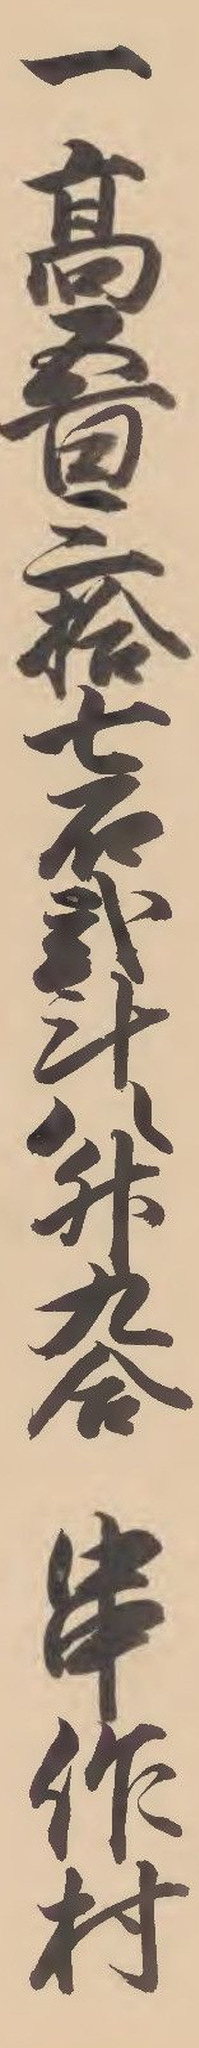一高五百三拾七石弐斗八升九合串作村

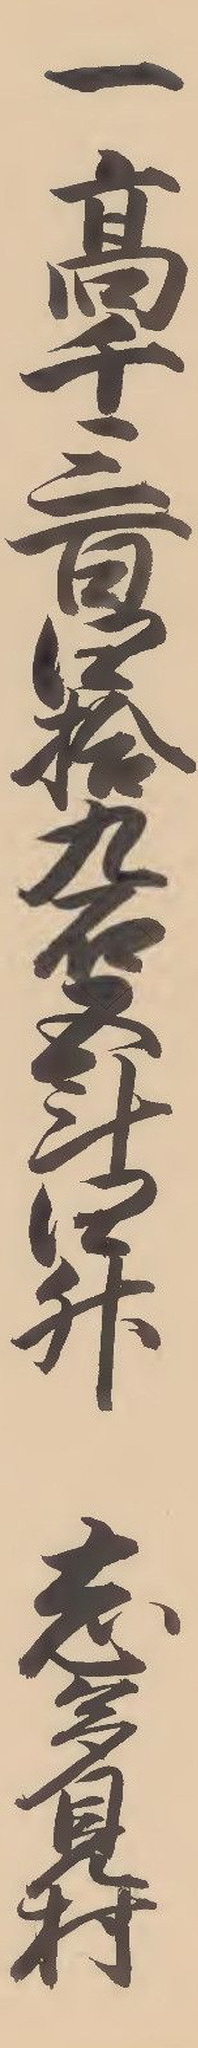一高千三百四拾九石五斗四升志多見村
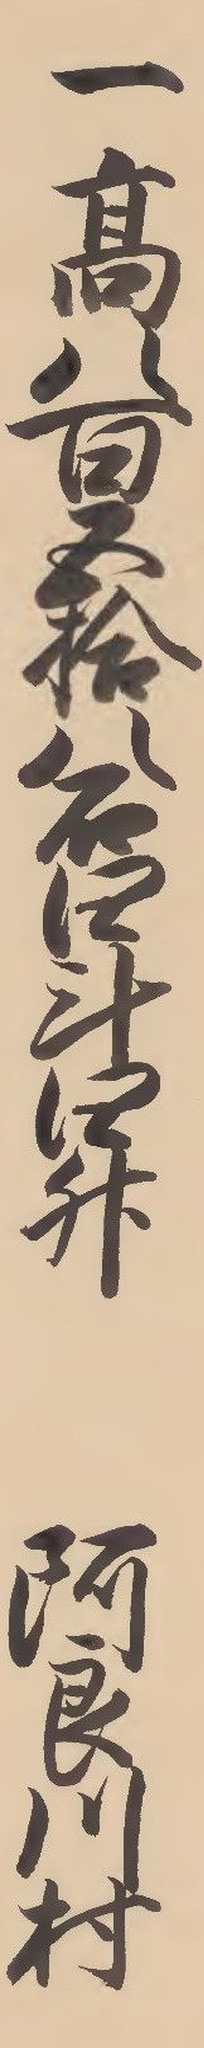一高八百五拾八石四斗四升阿良川村
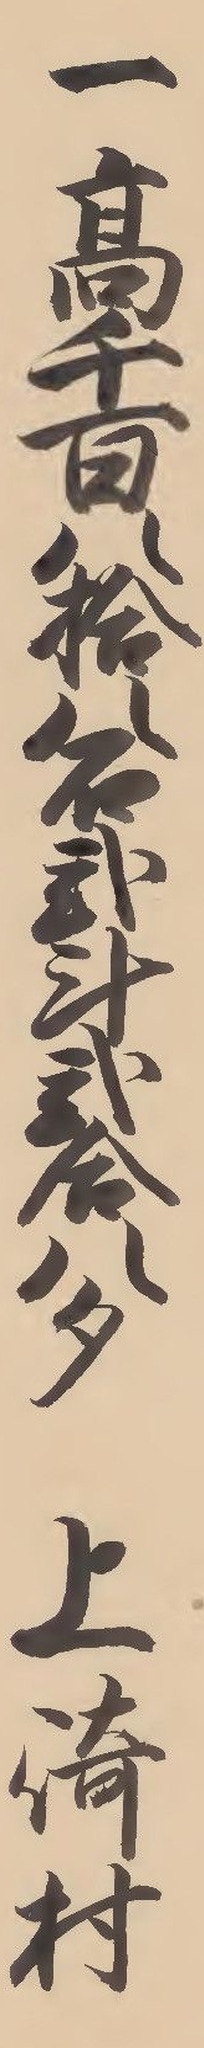一高千百八拾八石弐斗弐合八勺上崎村
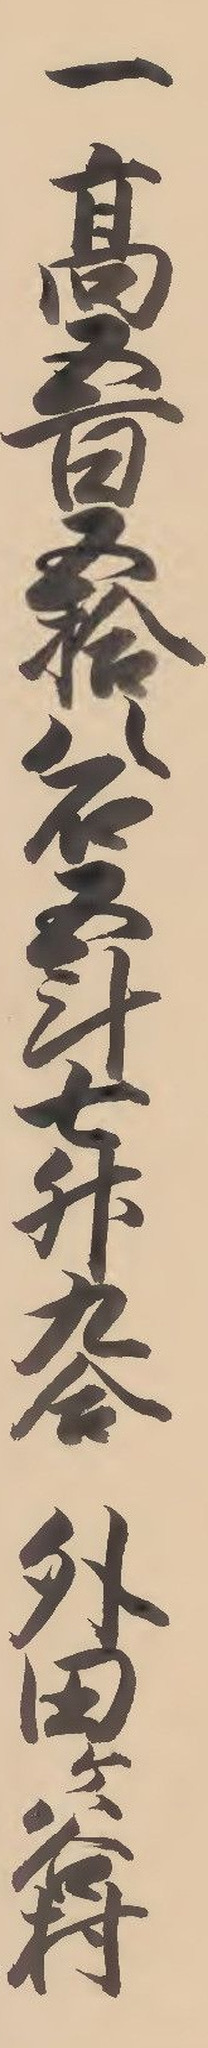一高五百五拾八石五斗七升九合外田ヶ谷村
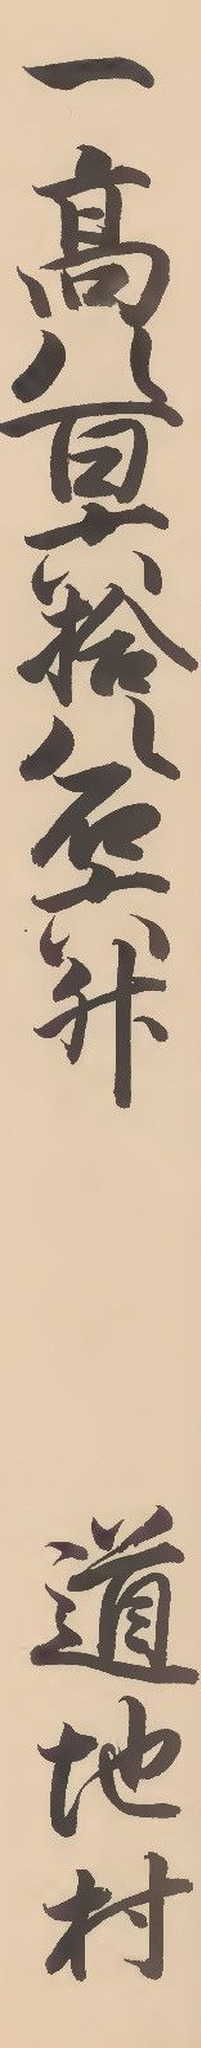一高八百六拾八石六升道地村
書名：武蔵国郷帳　下
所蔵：国立公文書館 National Archives of Japan
